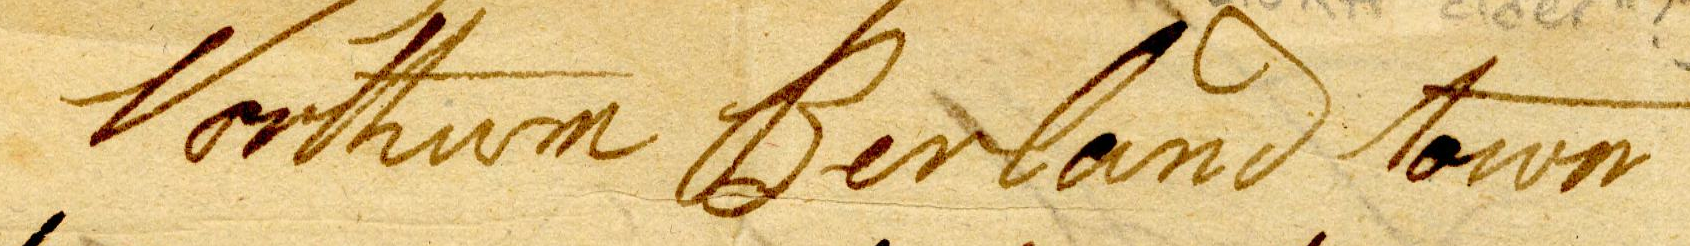Northern Berlandtown
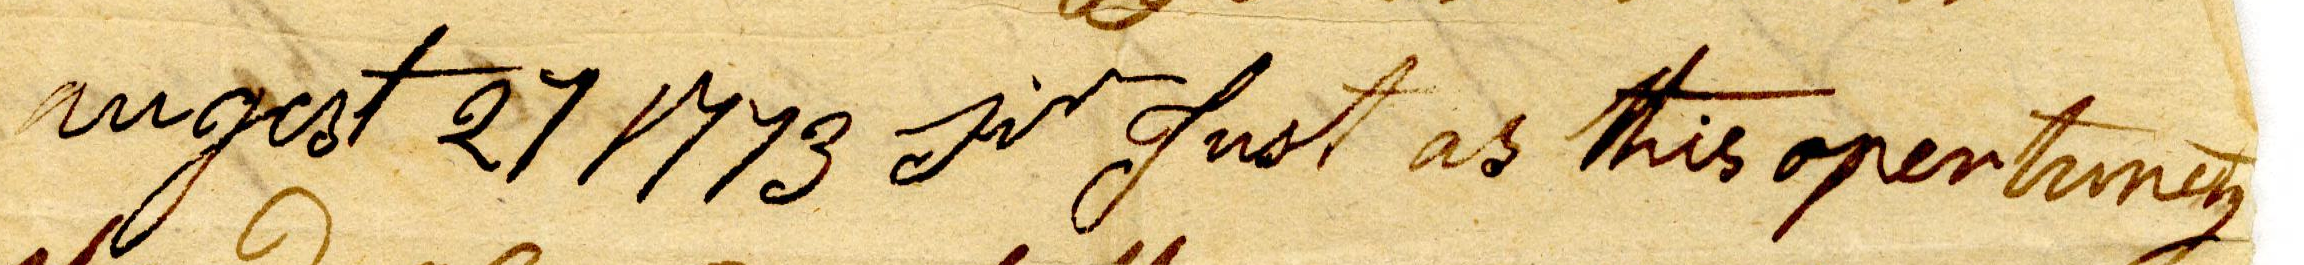augest 27 1773 si^r Just as this opertunity
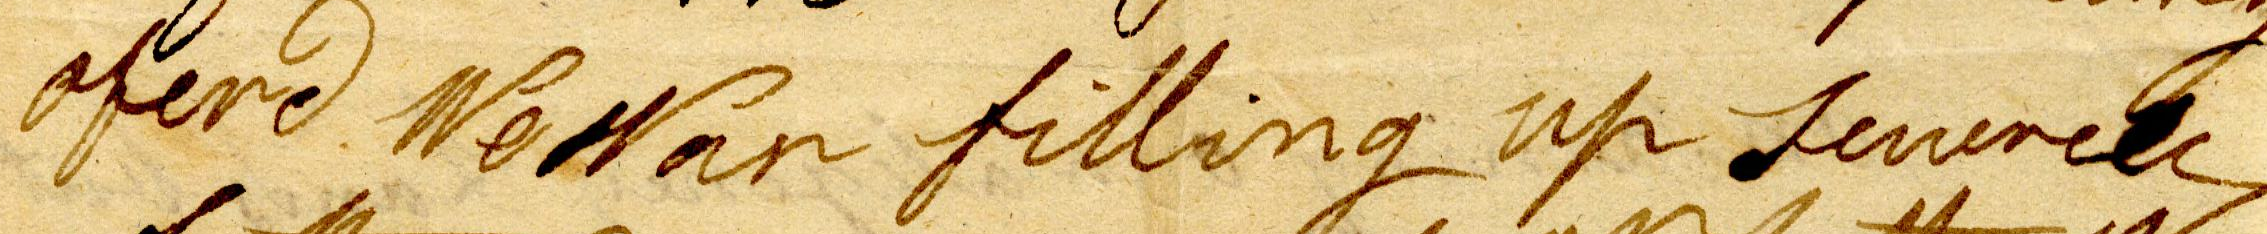oferd We War filling up severel
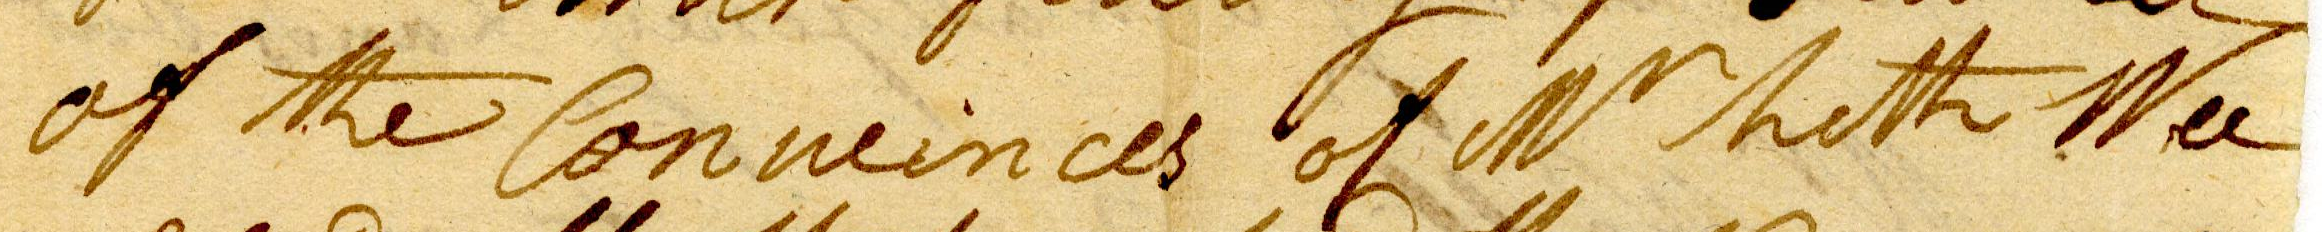of the Conveinces of M^r heth Wee
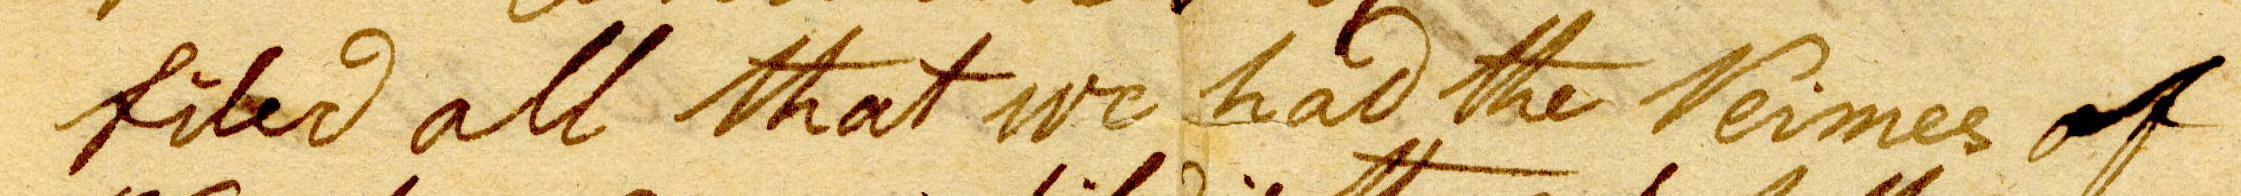filed all that we had the Neimes of
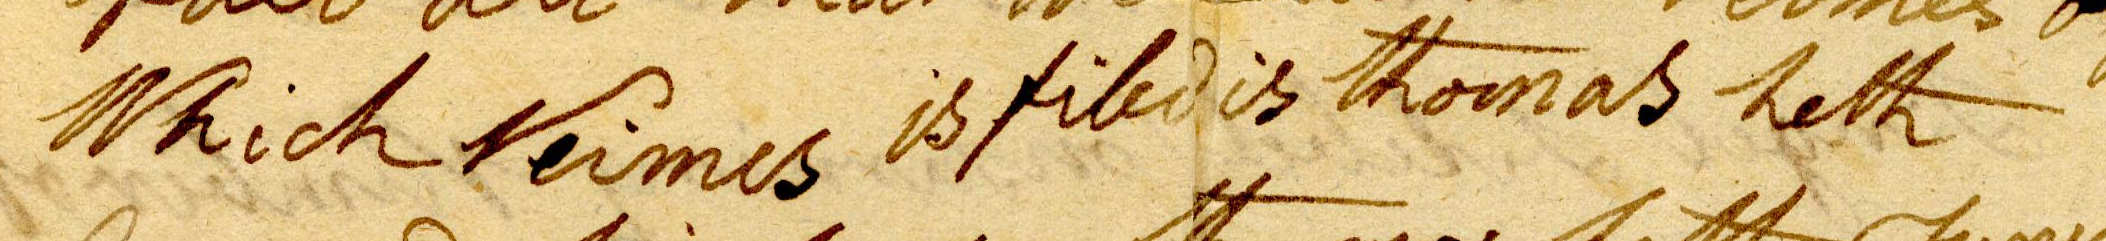Which Neimes is filed is thomas heth
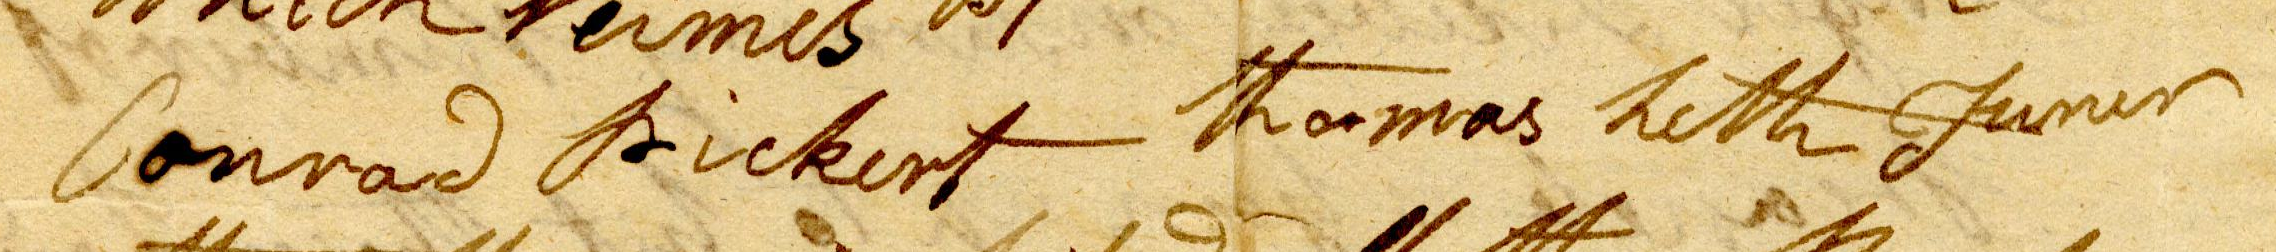Conrad Pickert thomas heth Juner
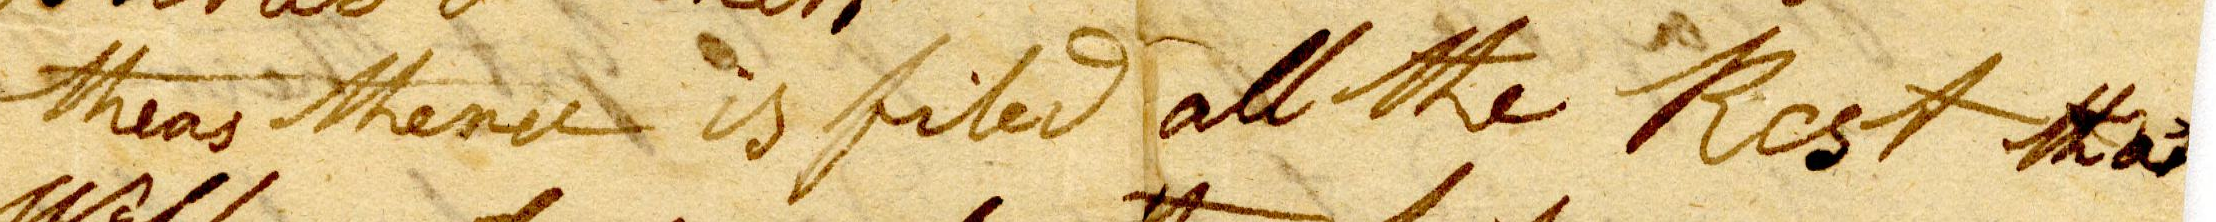Theas there is filed all the Rest that
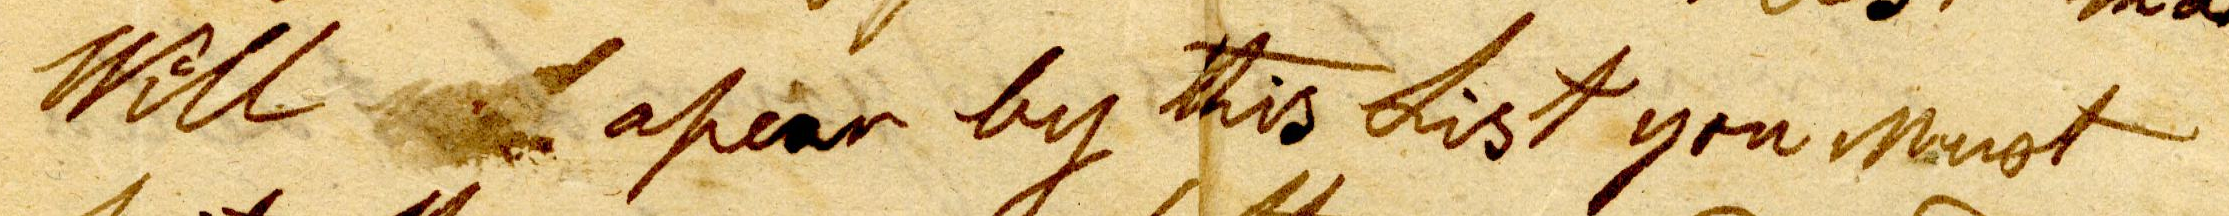Will [___] apear by this List you must
